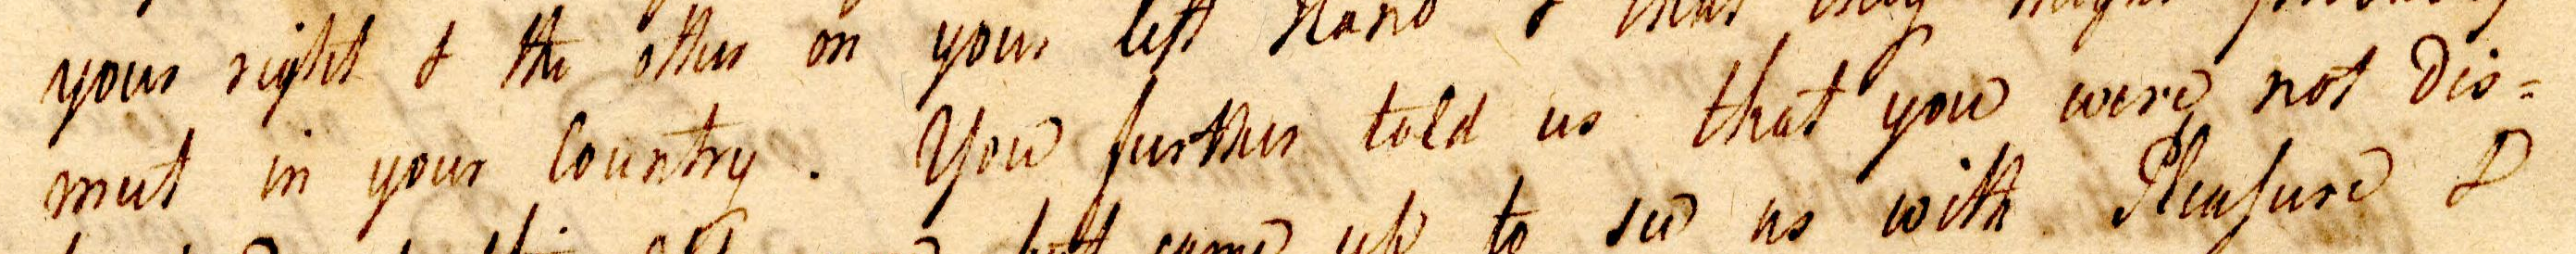meet in your Country. You further told us that you were not dis-
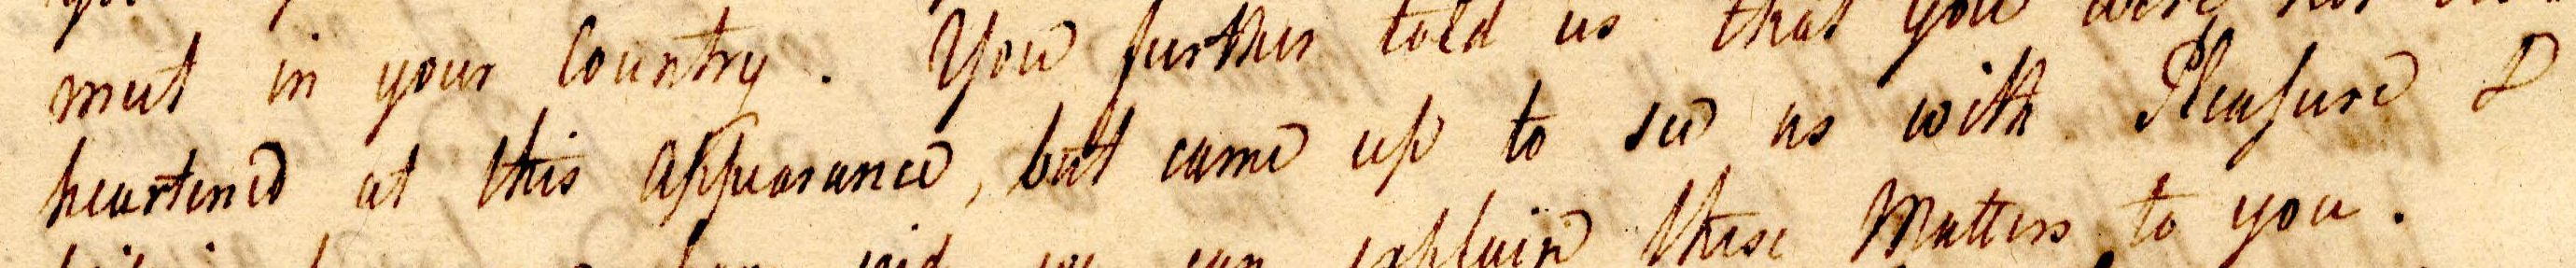heartened at this Appearance, but came up to see us with Pleasure &
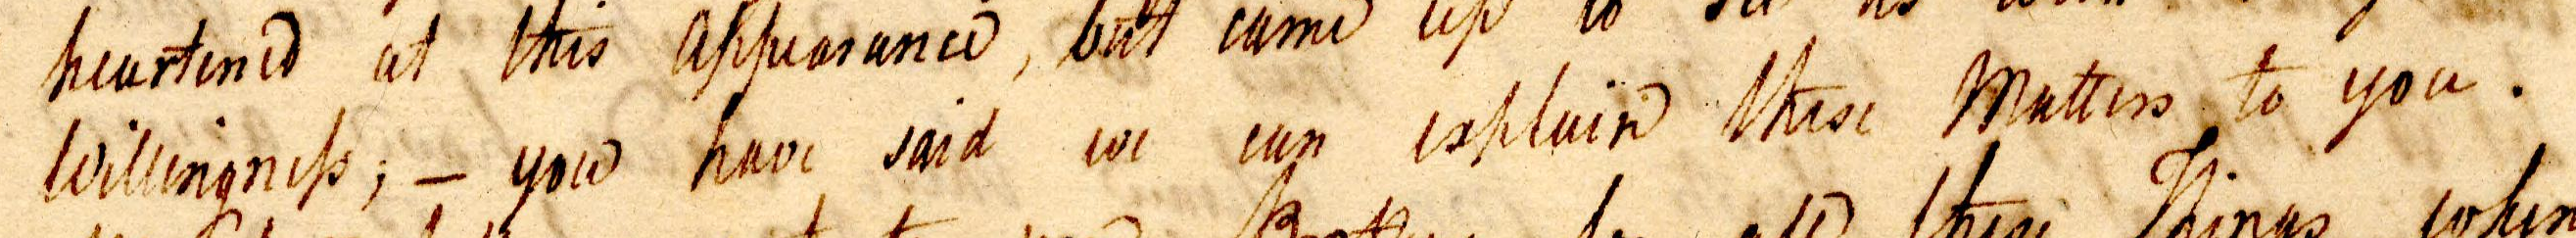Willingness;- you have said we can explain these Matters to you.
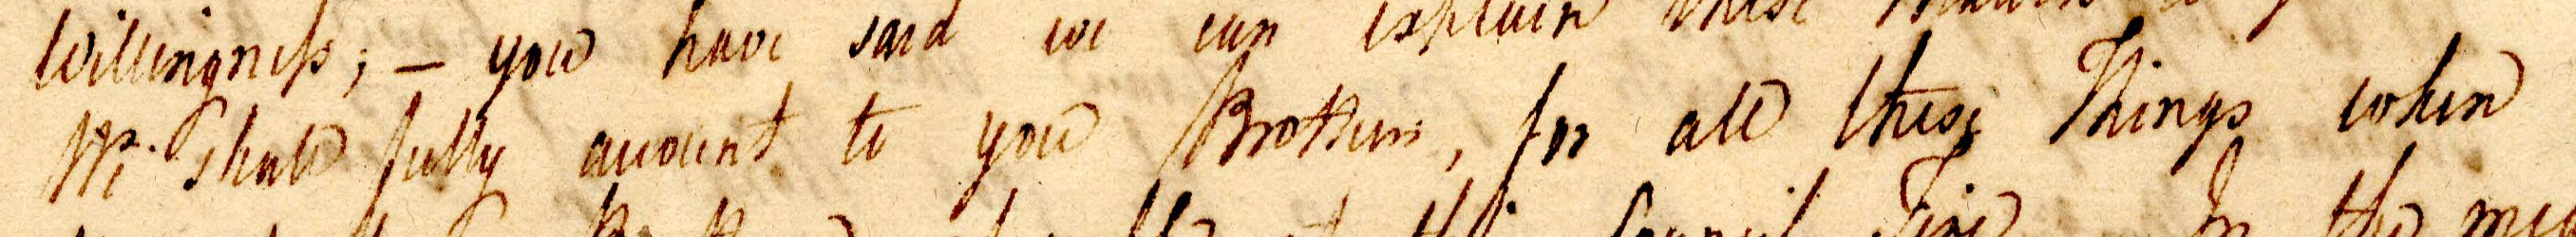We shall fully account to you Brothers, for all these Things when
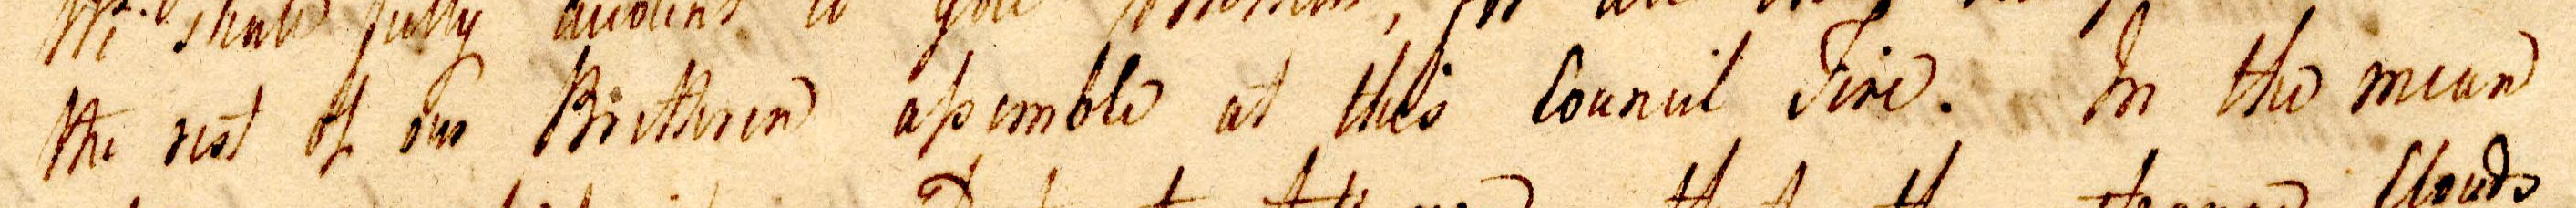the rest of our Brethren assemble at this Council Fire. In the mean
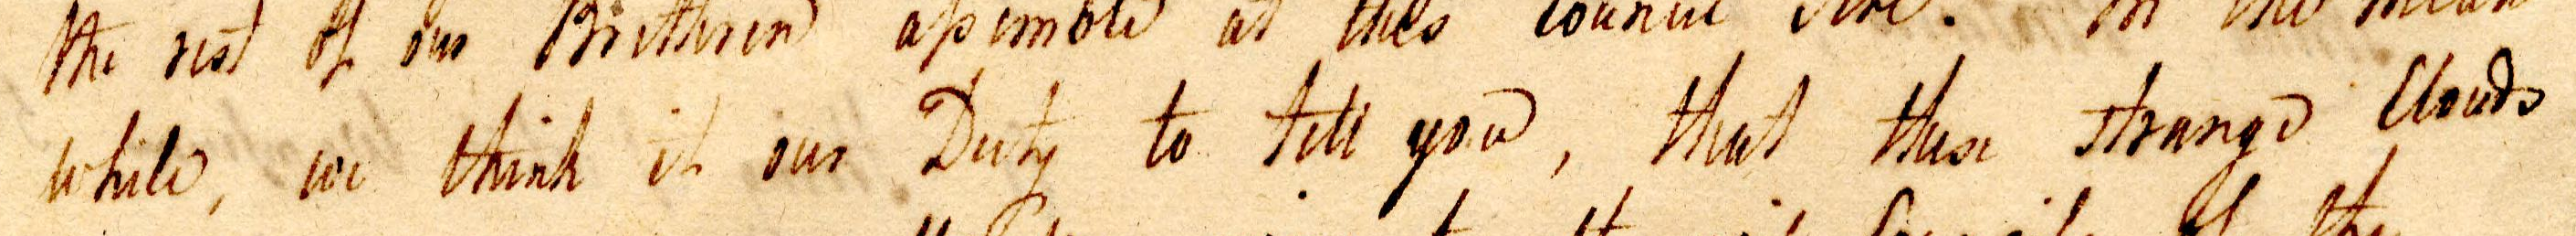while, we think it our Duty to tell you, that these strange Clouds
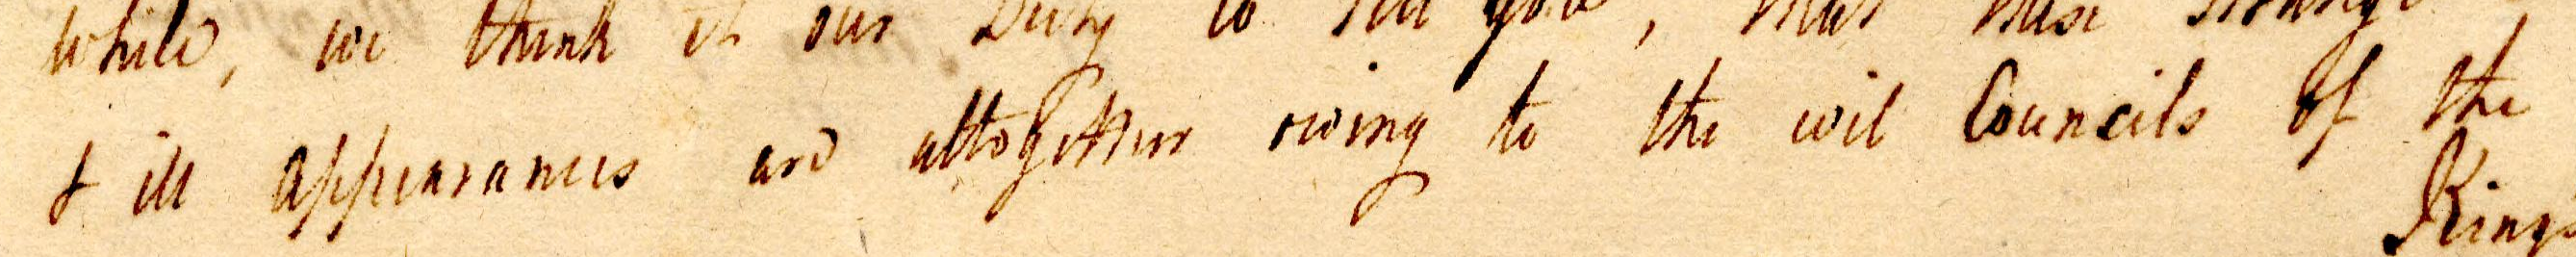& ill appearances are altogether owing to the evil Councils of the
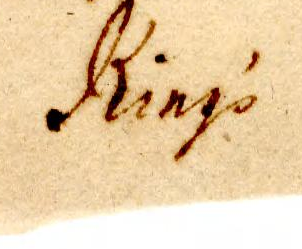King's
